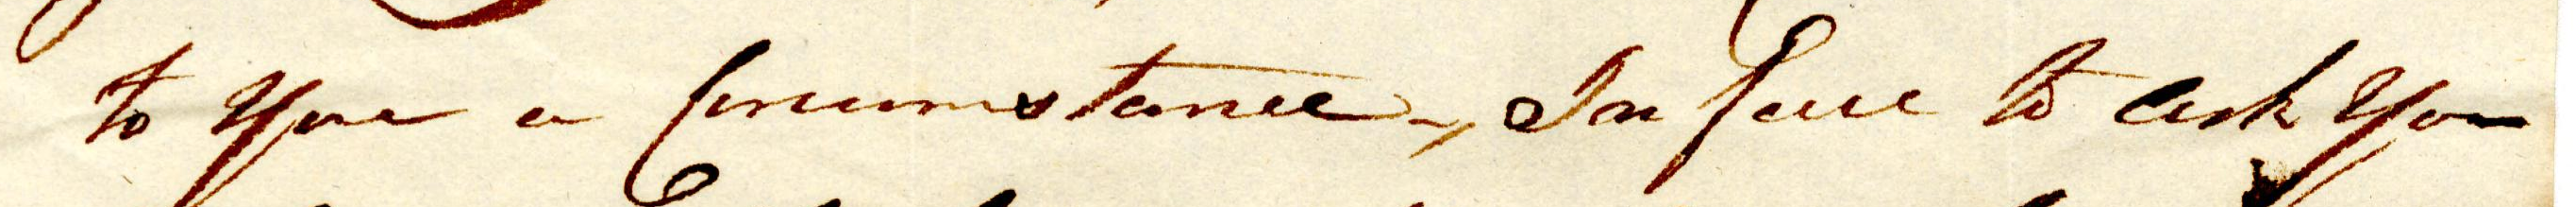to you a Circumstance-, In force to ask you
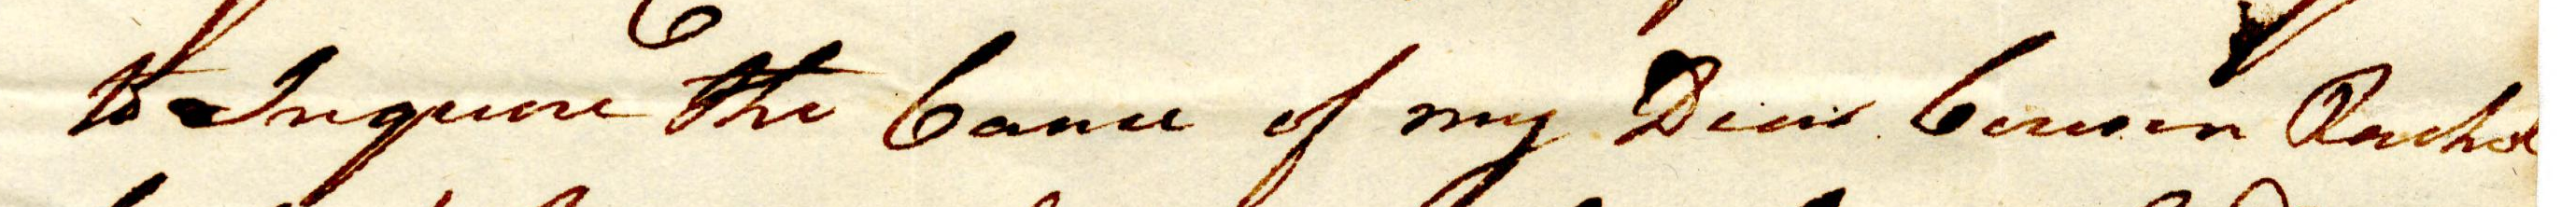to Inquire the Cause of my Dear cousin Rachael
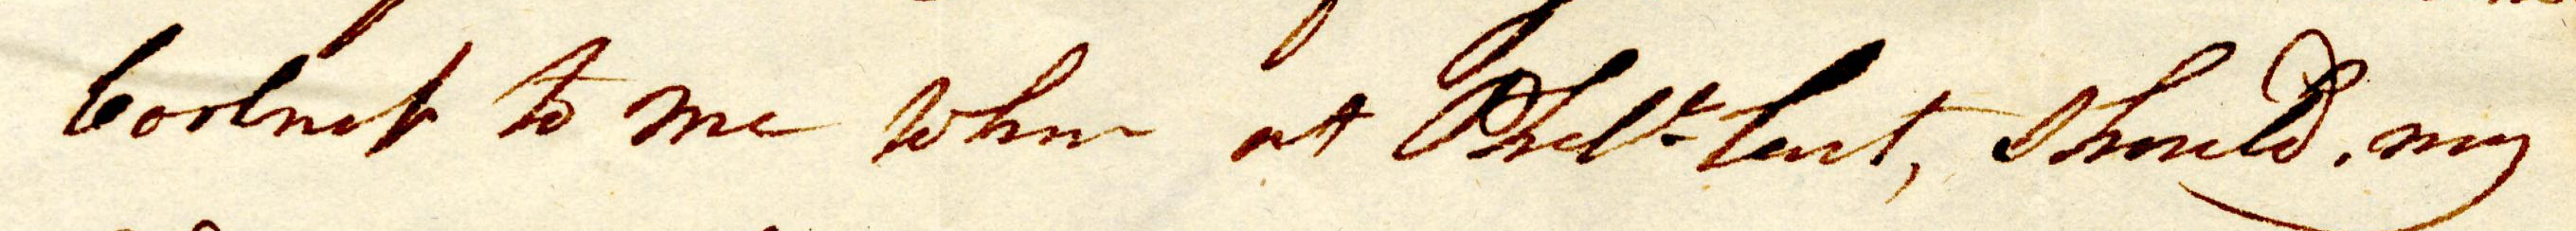Cortnes to me when at Phil^a. but, should my
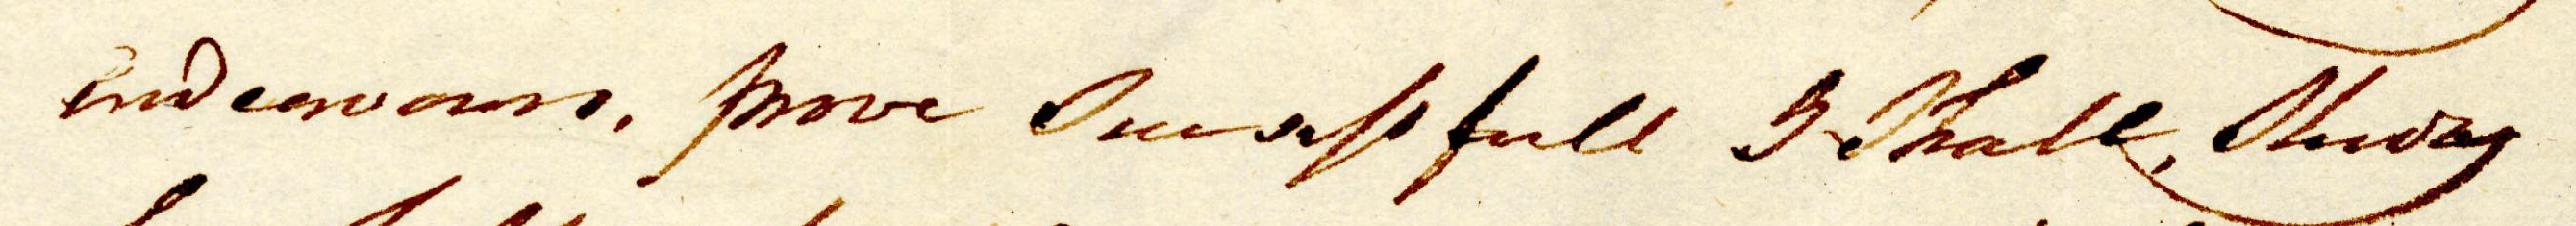endeavors prove Successful I Shall, study
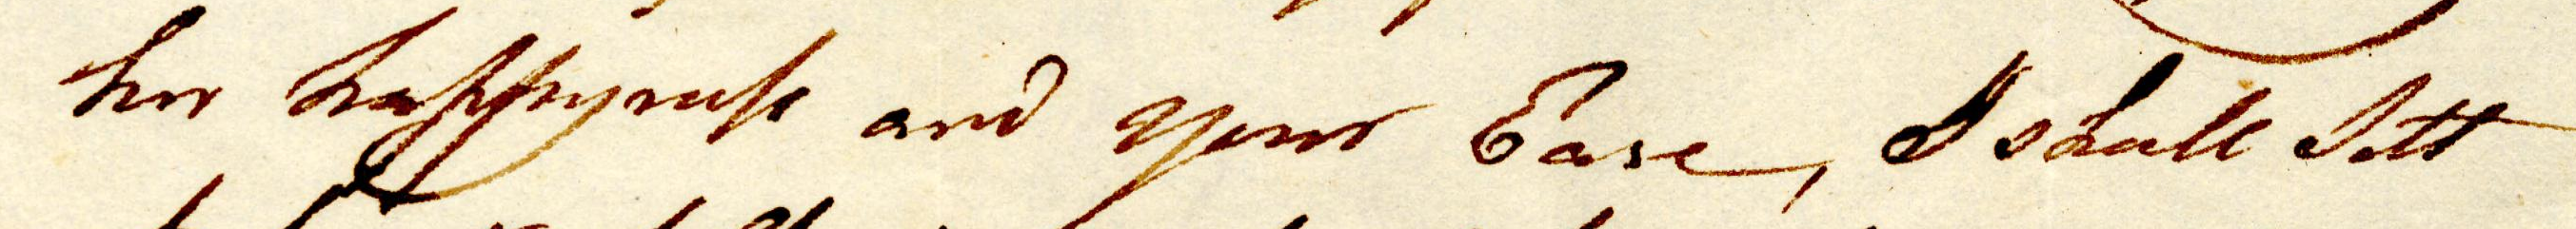her happyness and your Ease, I shall sett
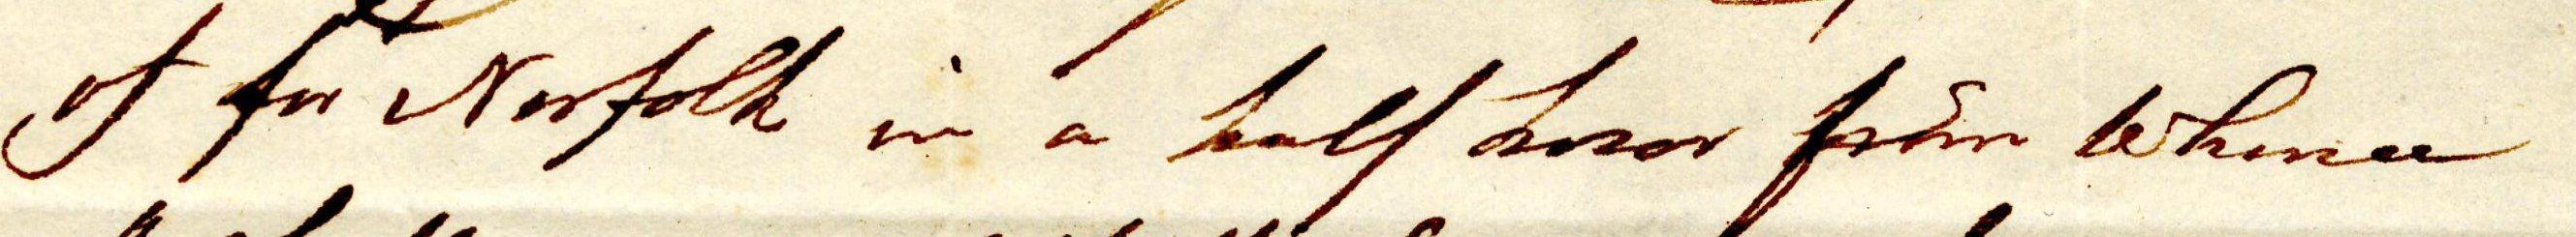of for Norfolk in a half hour from Whence
